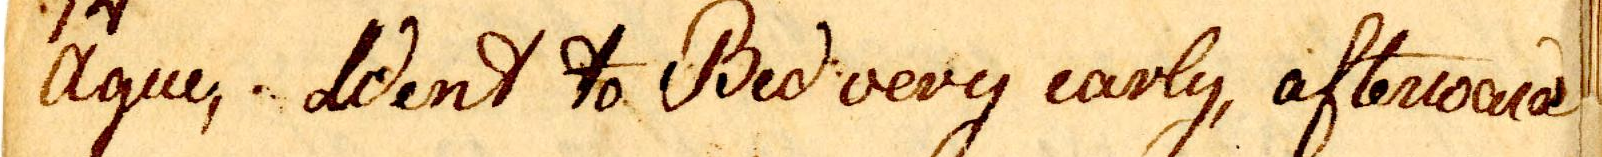Ague, Went to Bed very early, afterward
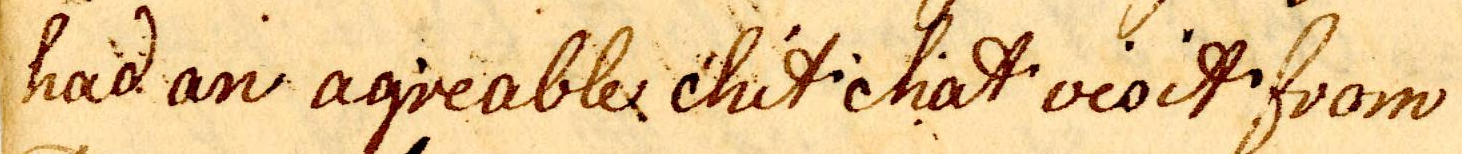had an agreable chit chat visit from
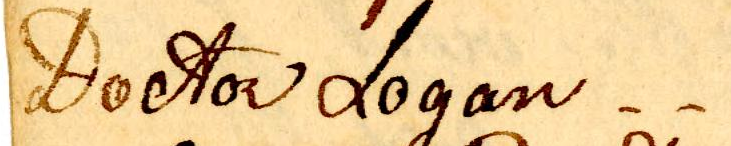Doctor Logan--
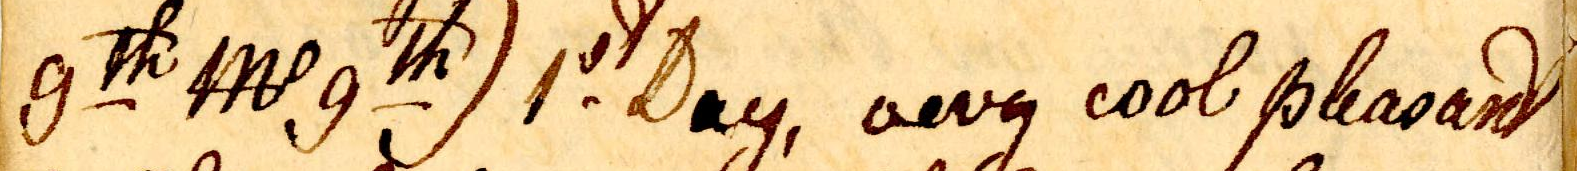9^th M^o 9^th) 1^st Day, very cool pleasant
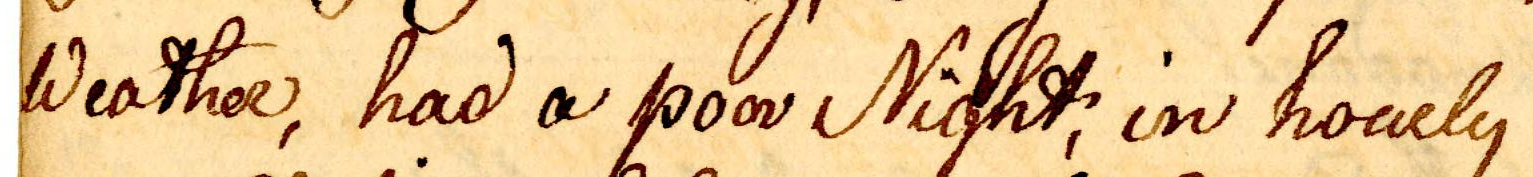Weather, had a poor Night, in hourly
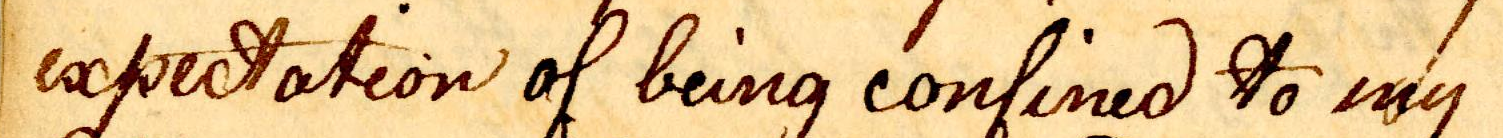expectation of being confined to my
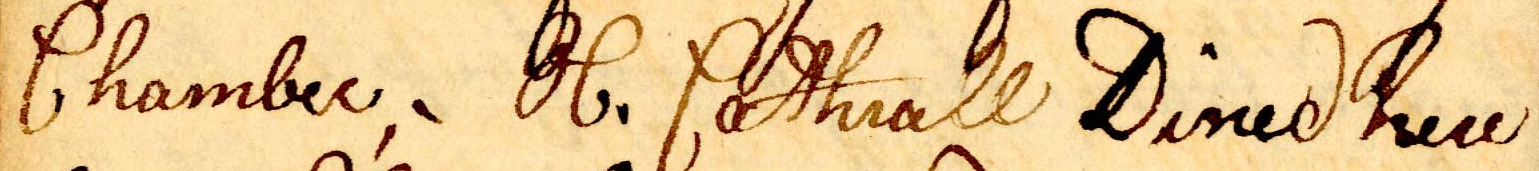Chamber, H. Cathrall Dined here
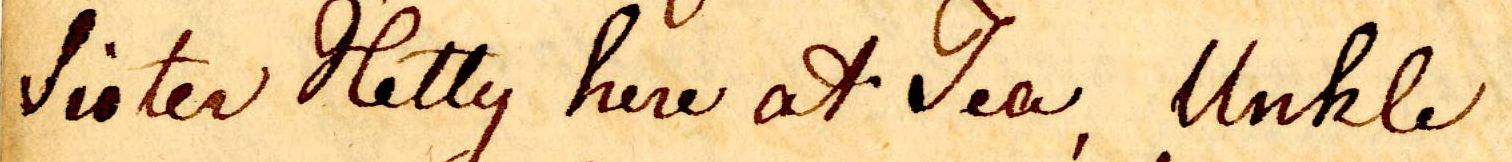Sister Hetty here at Tea, Unkle
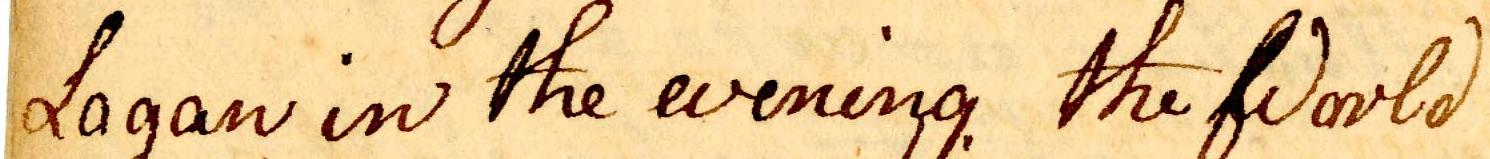Logan in the evening the World
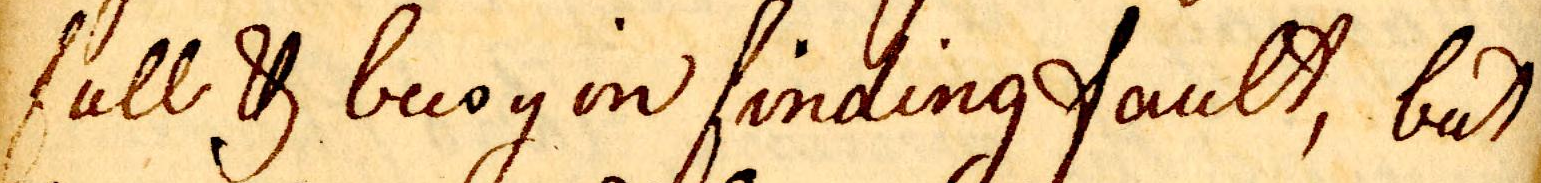full & busy in finding fault, but
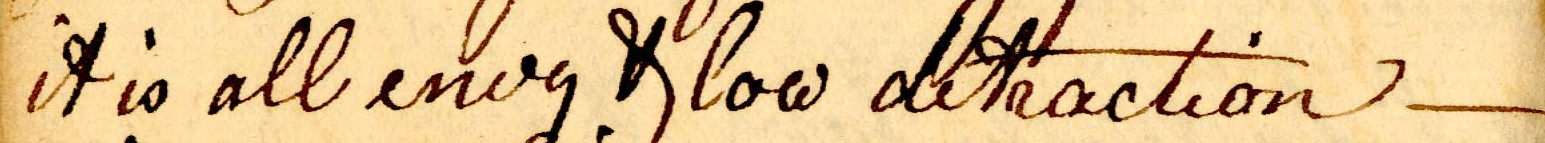it is all envy & low detraction
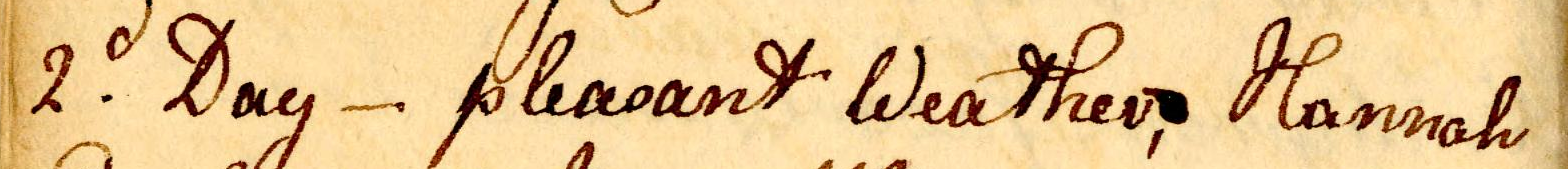2^d. Day- pleasant Weather, Hannah
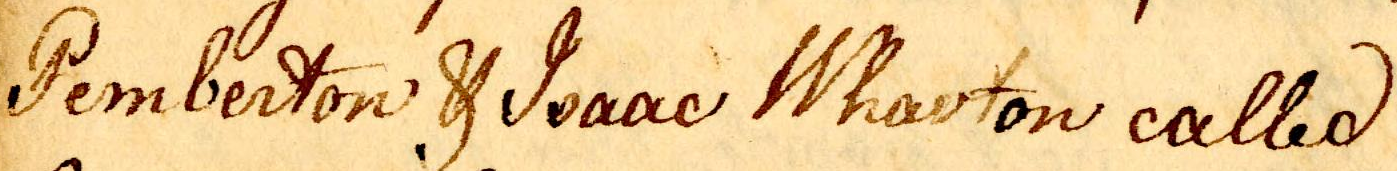Pemberton & Isaac Wharton called
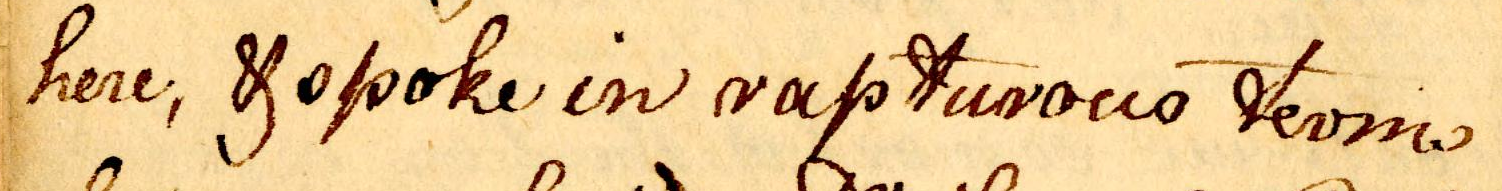here, & spoke in rapturous terms
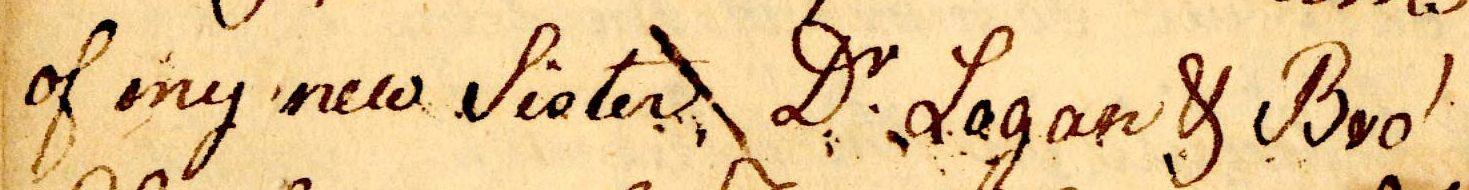of my new Sister, D^r. Logan & Bro'
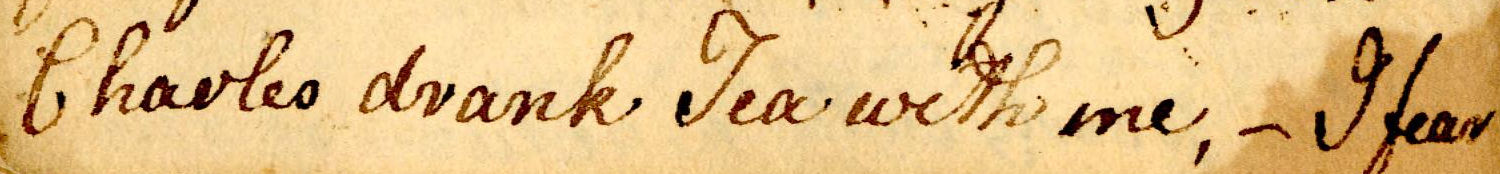Charles drank Tea with me,- I fear
